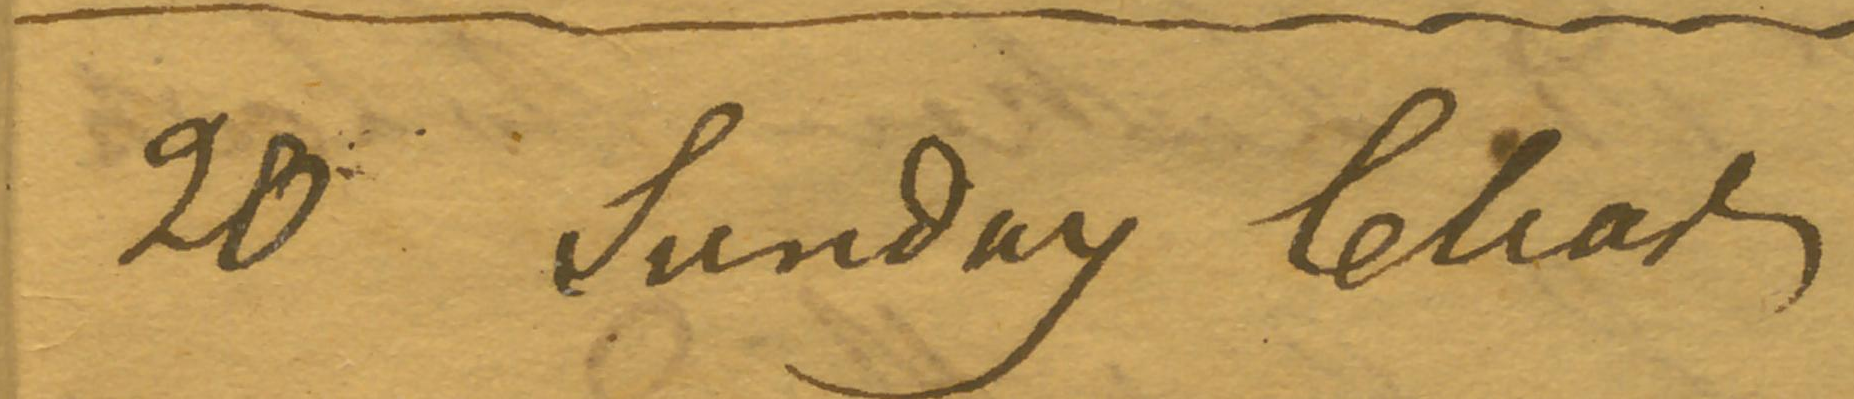20 Sunday Clear
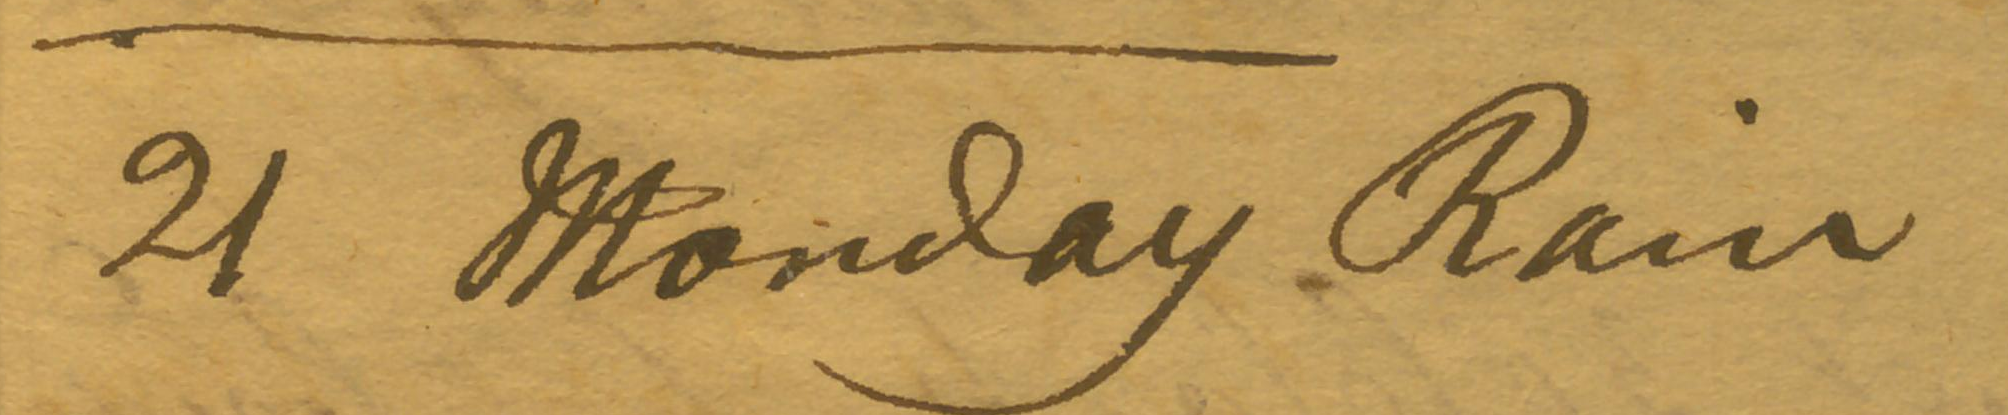21 Monday Rain
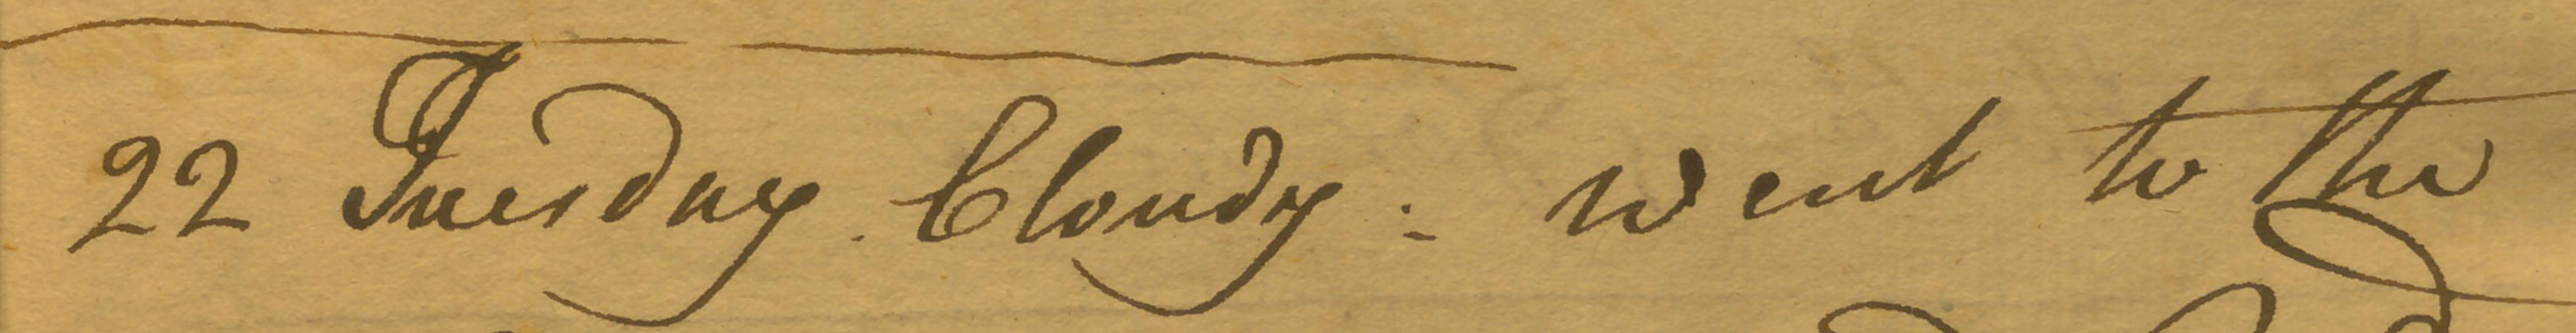22 Tuesday Cloudy. went to the
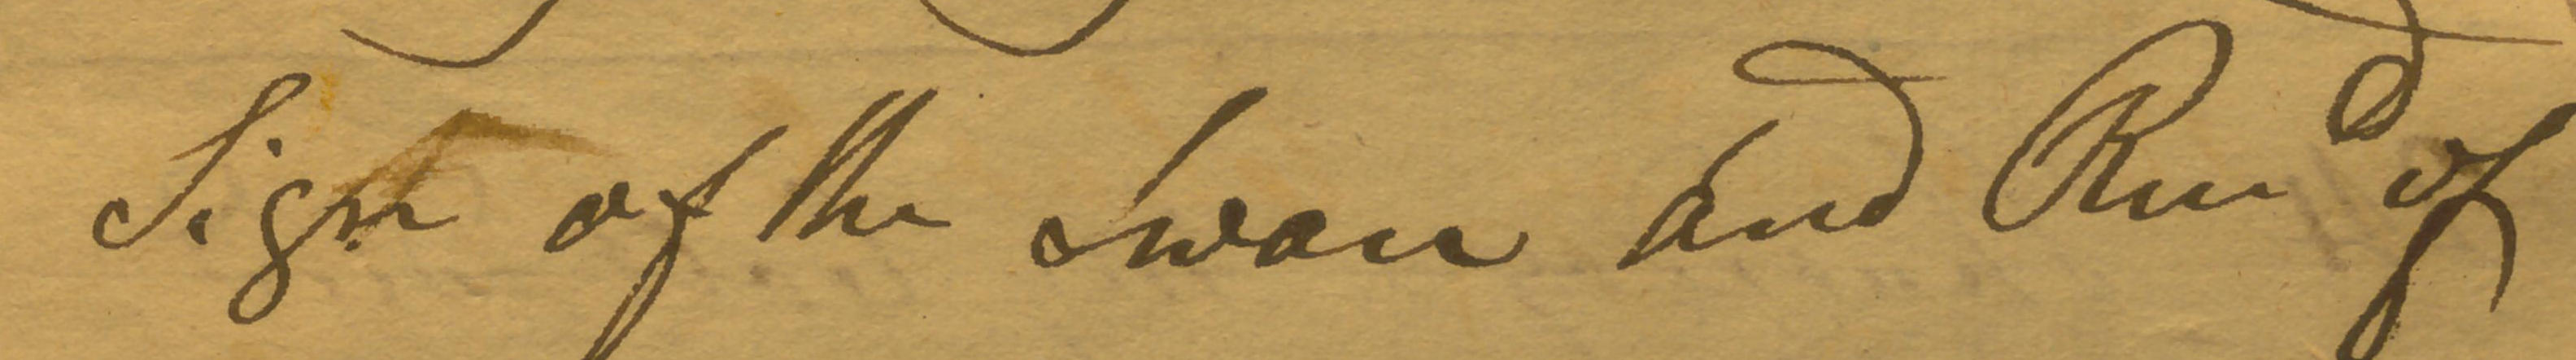Sign of the Swan and Rece^d of
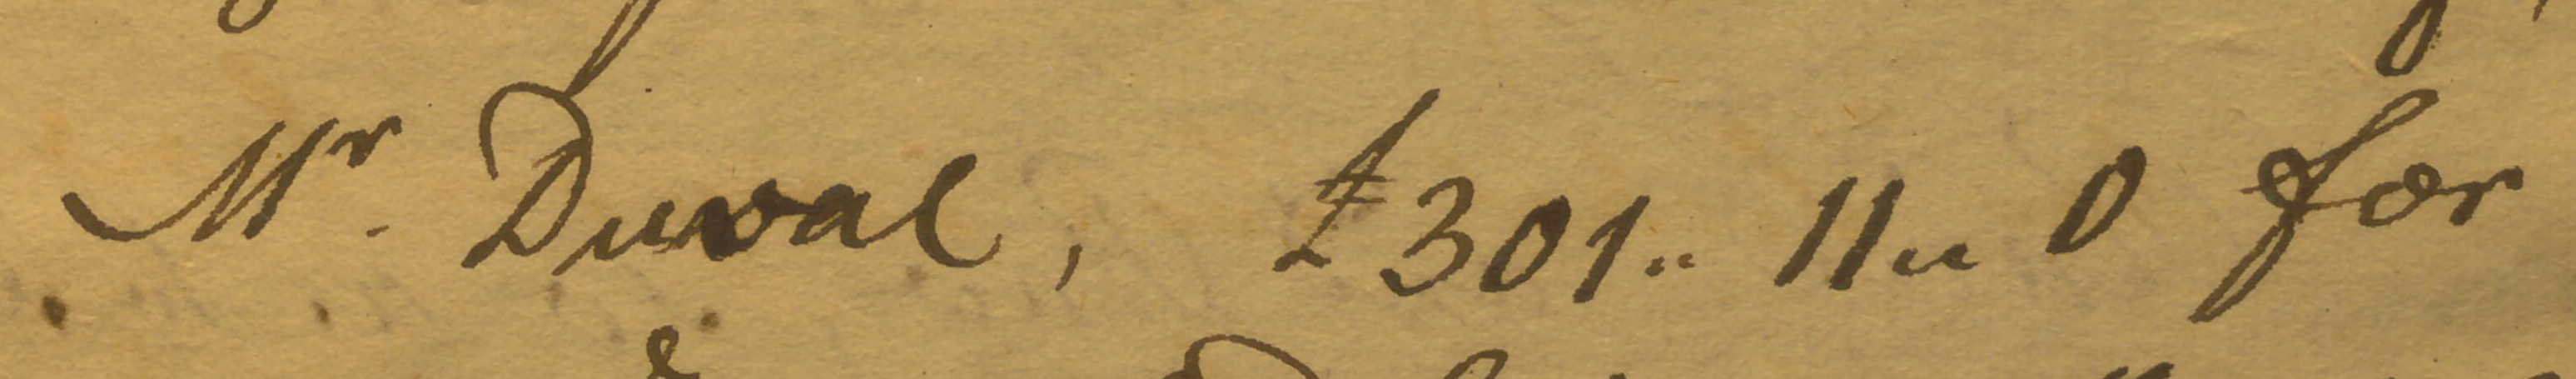M^r Duval, £301..11..0 for
